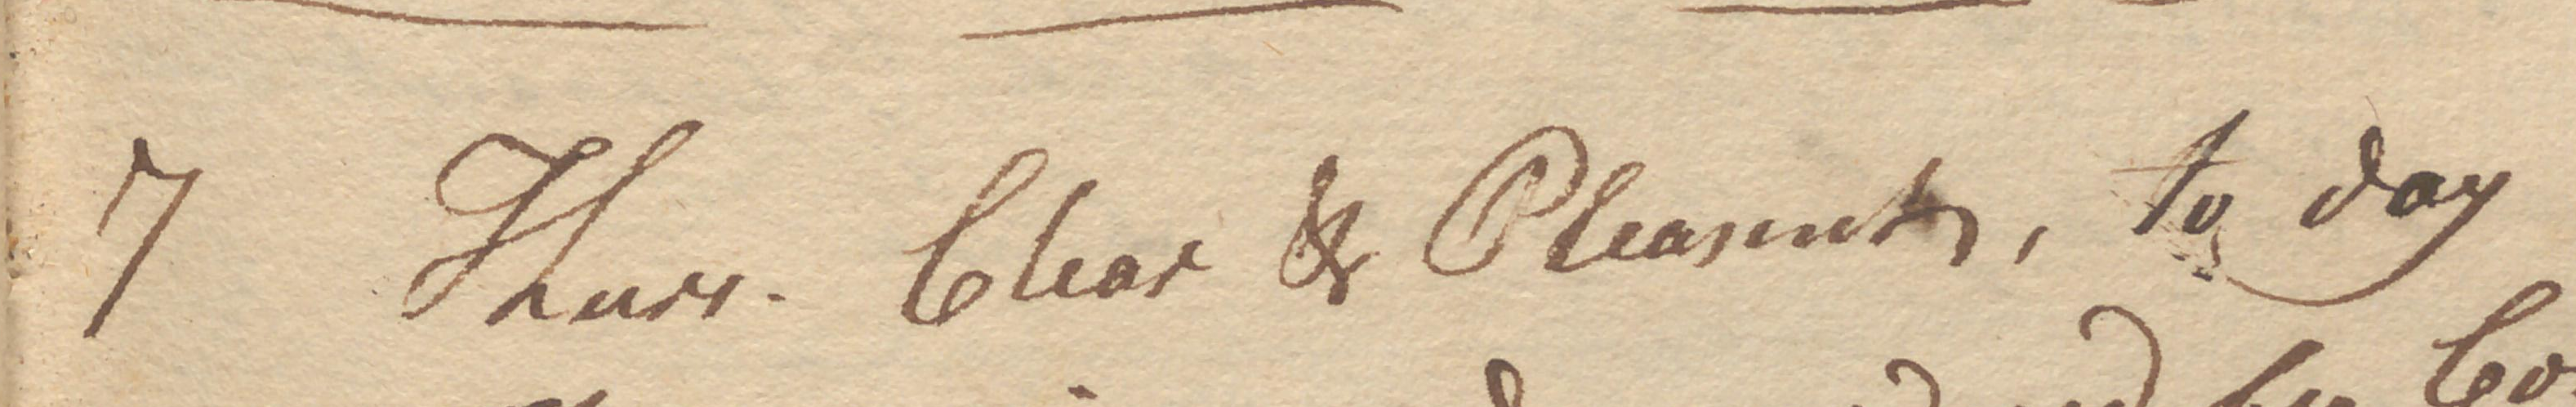7 Thurs. Clear & Pleasent, to day
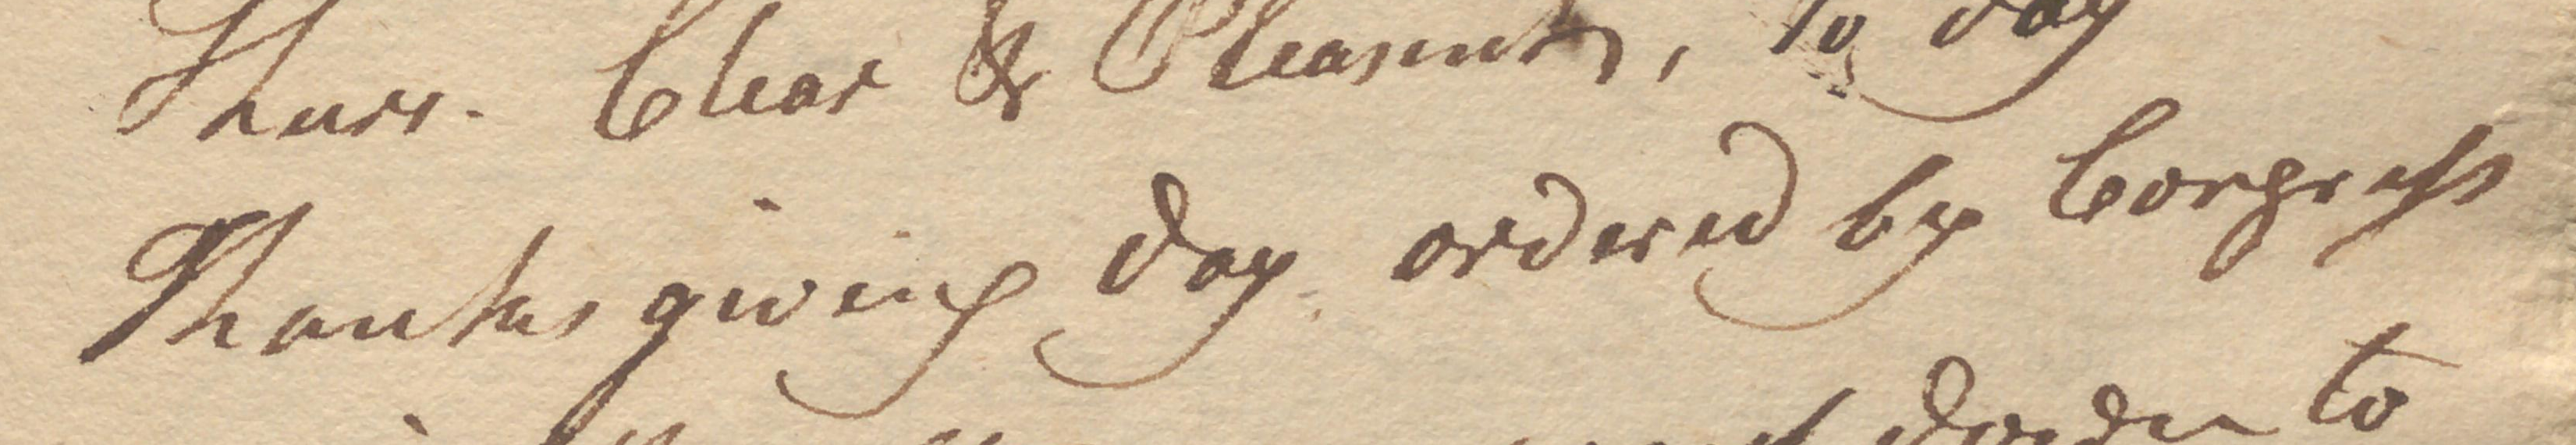Thanksgiving day ordered by Congress
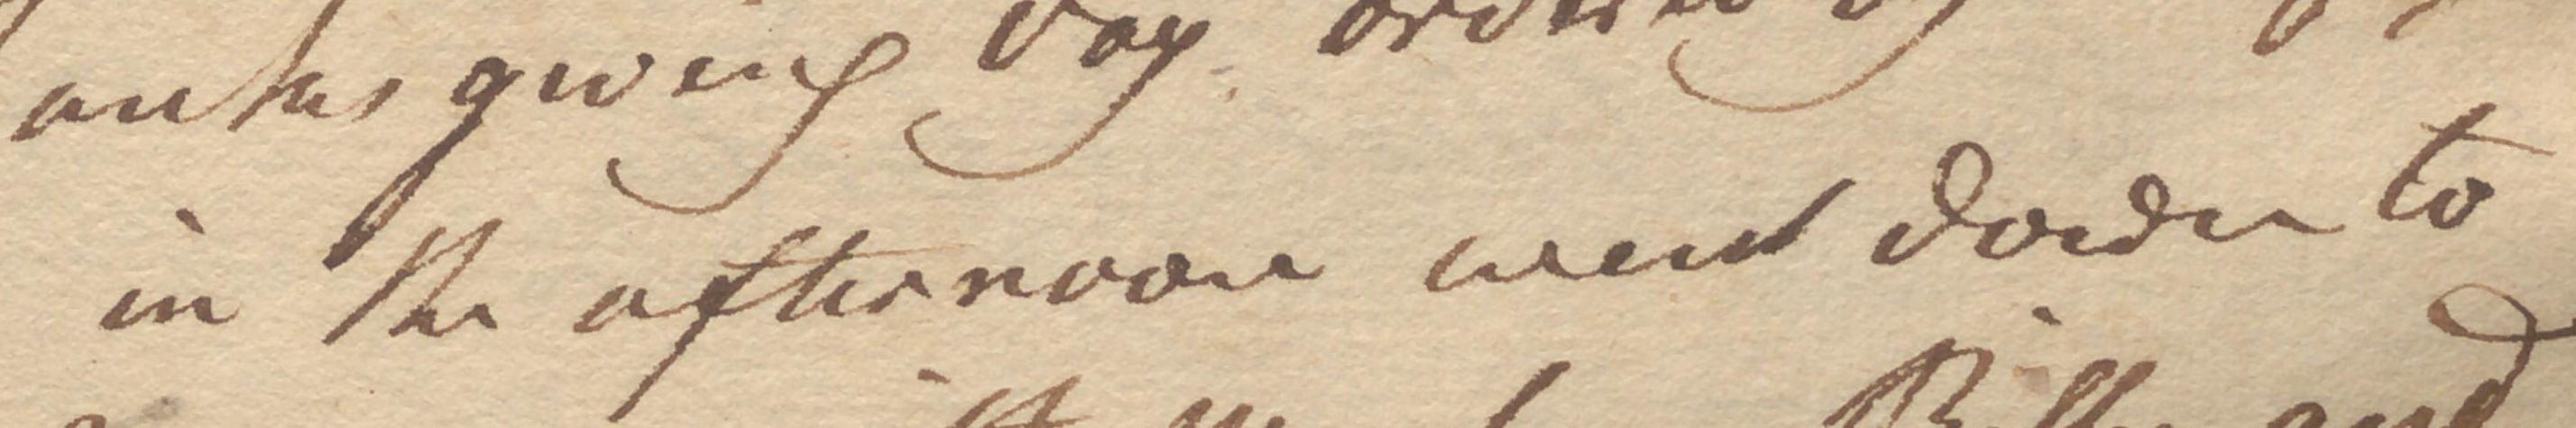in the afternoon went down to
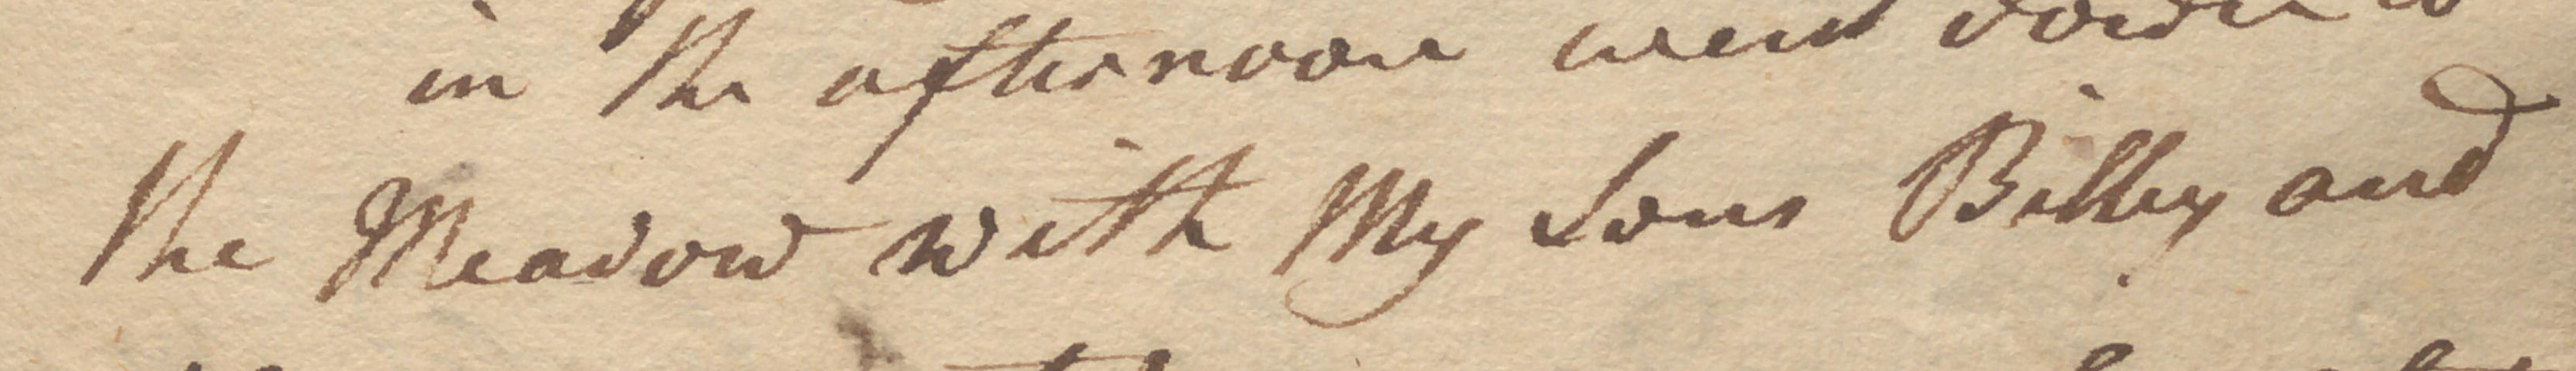the Meadow with My Sons Billey and
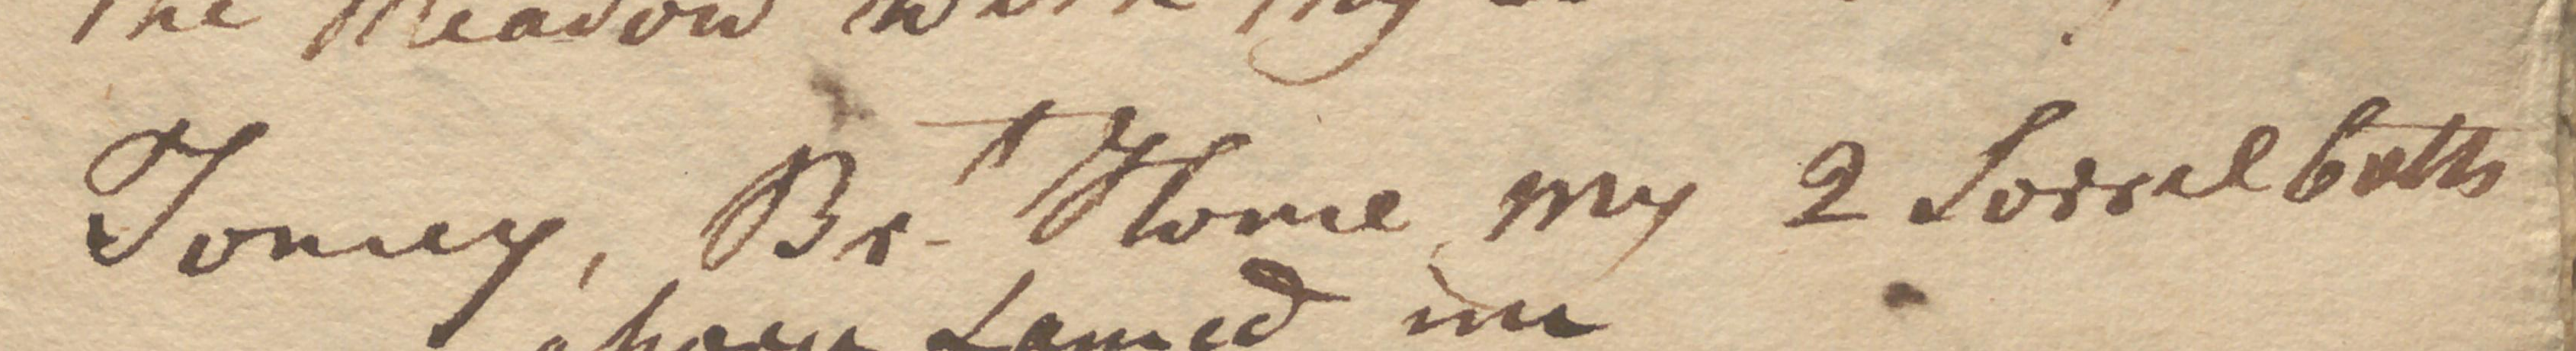Tomey, Br^t. Home my 2 Sorrel Colts
